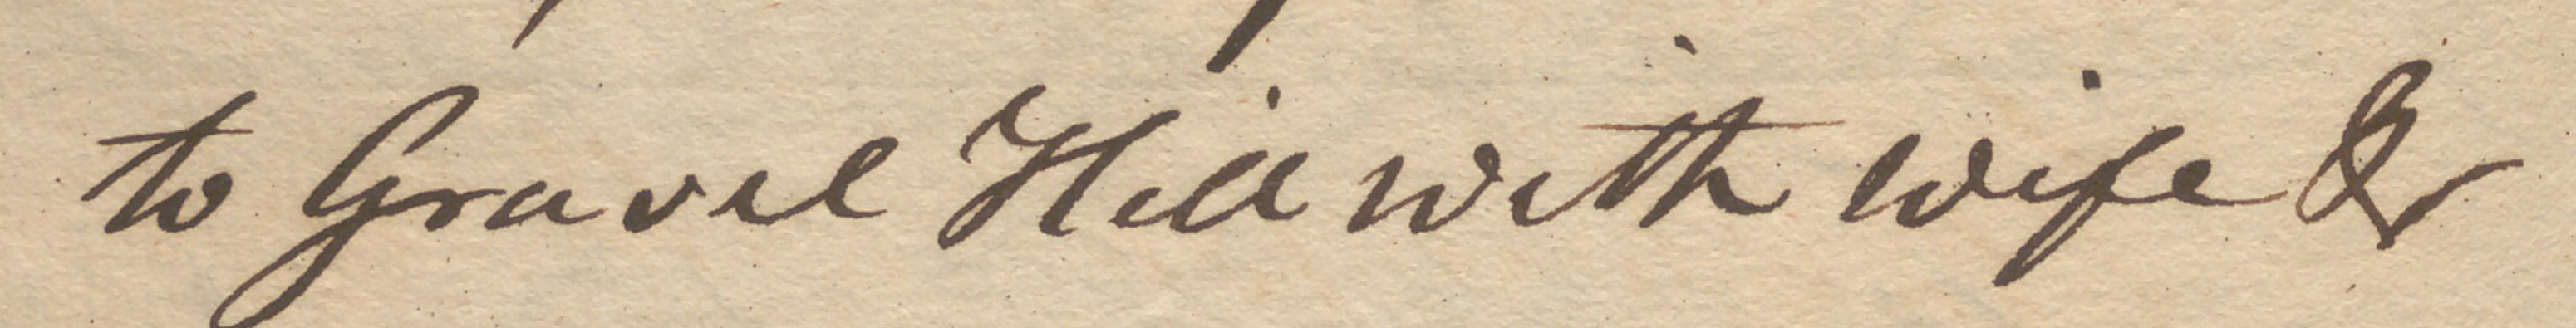to Gravel Hill with wife &
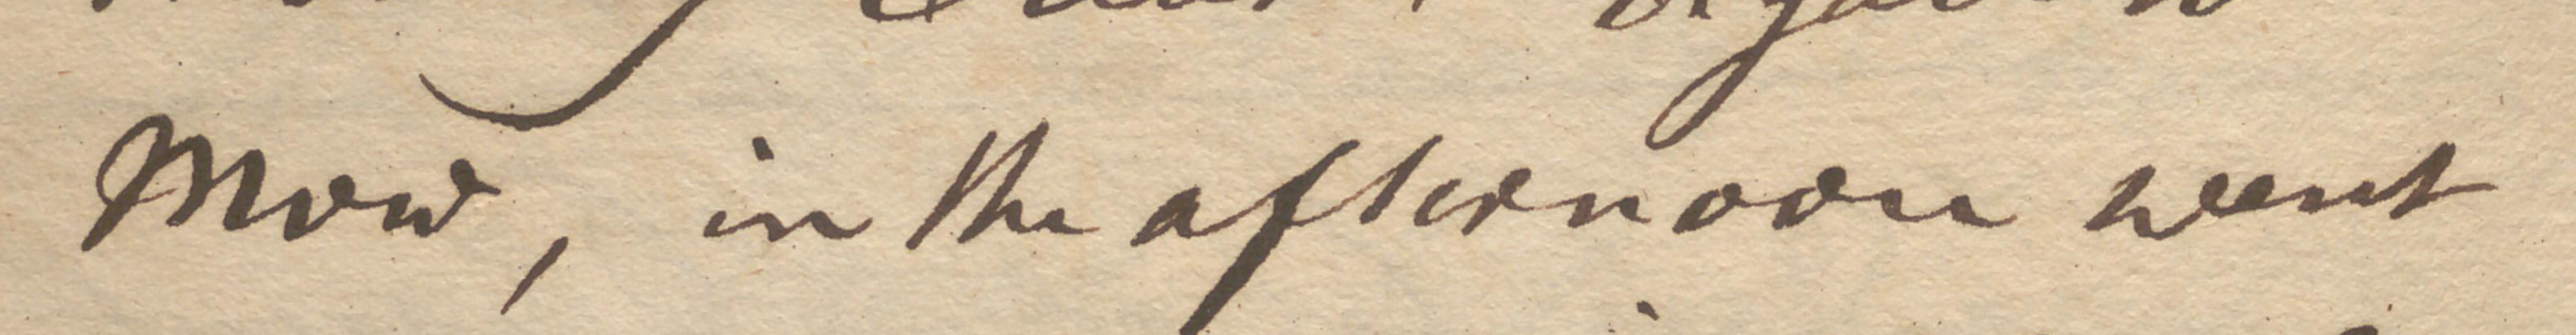Mow, in the afternoon went
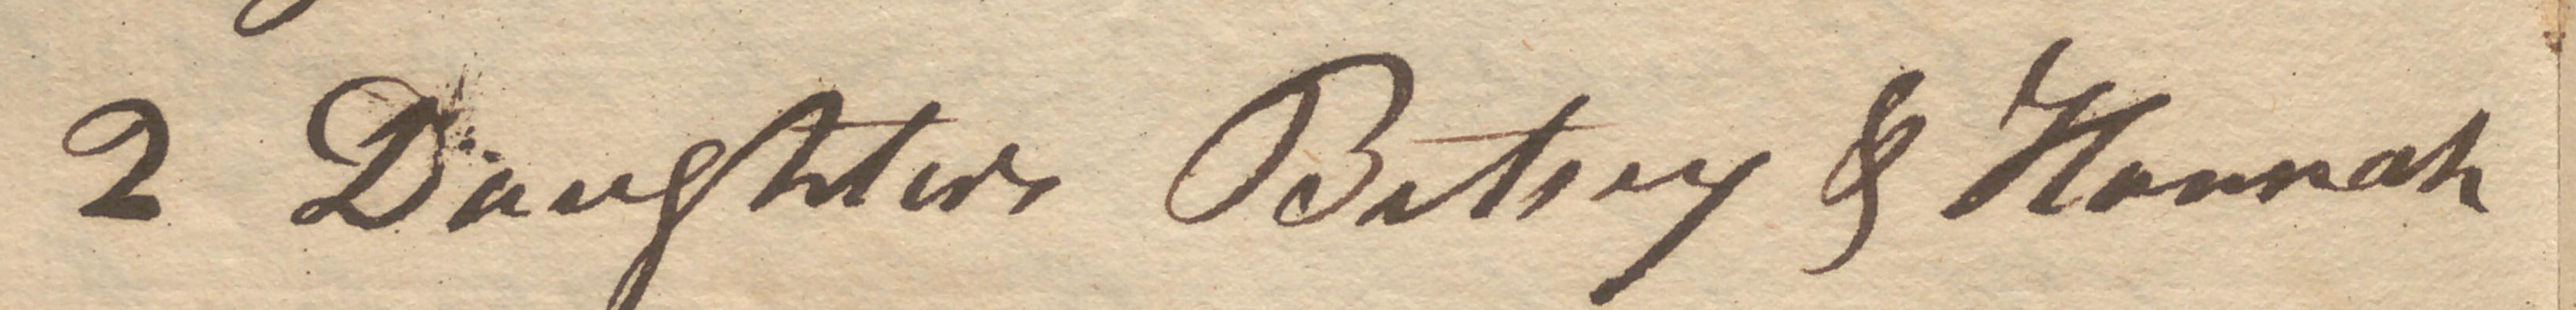2 Daughters Betsey & Hannah
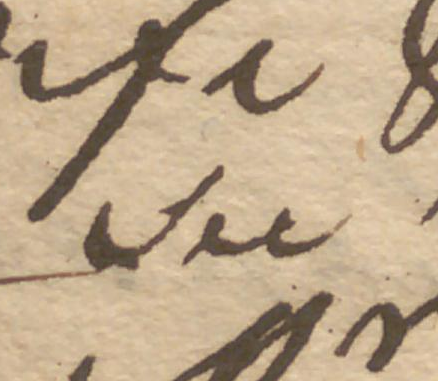see
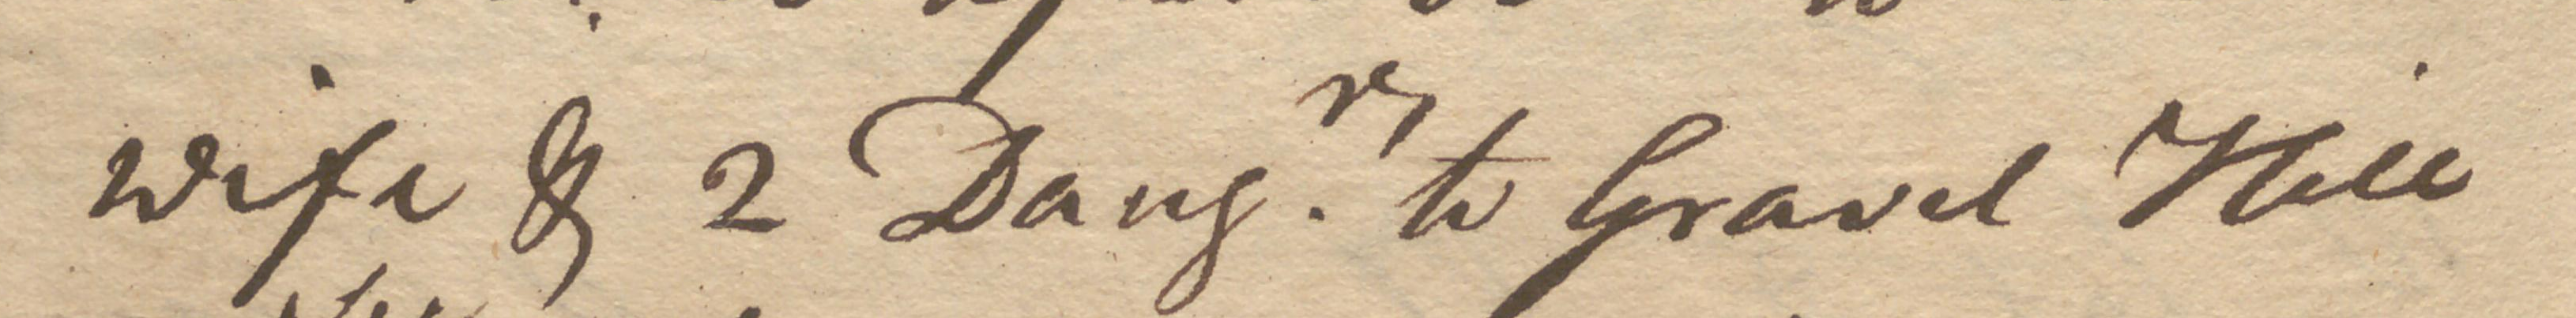wife & 2 Daug^rs. to Gravel Hill
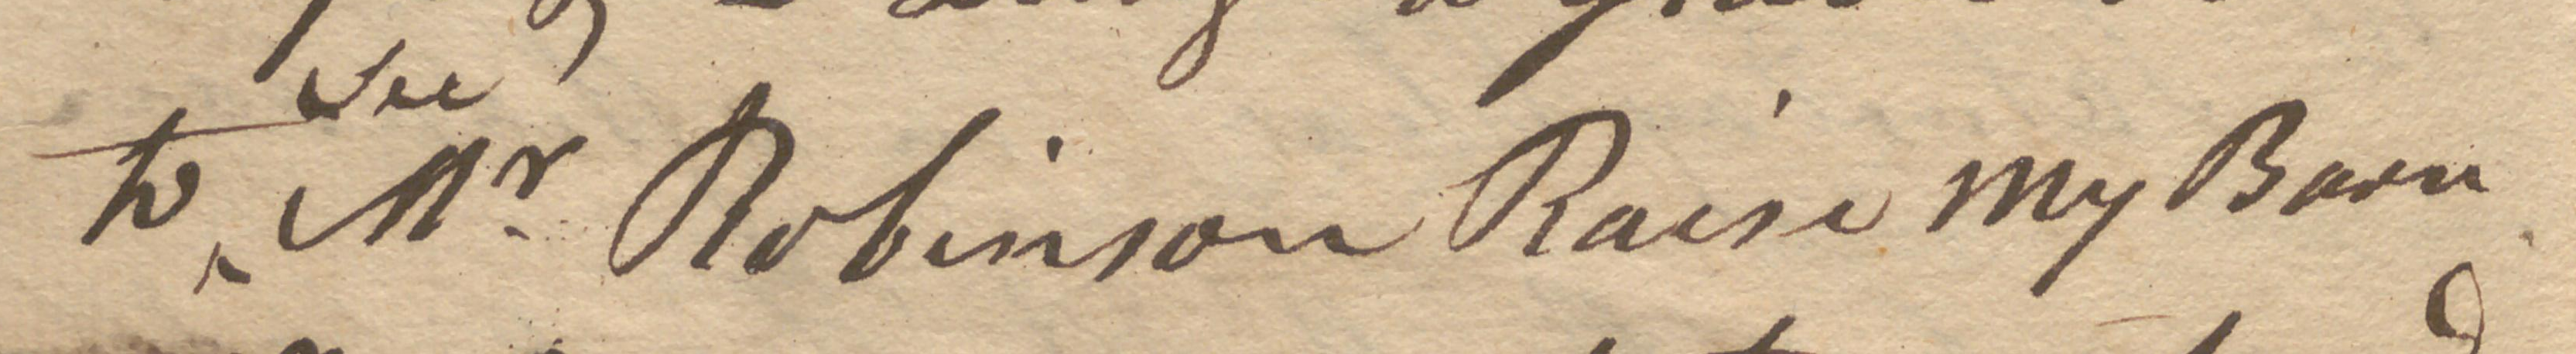to ^ M^r. Robinson Raise My Barn
